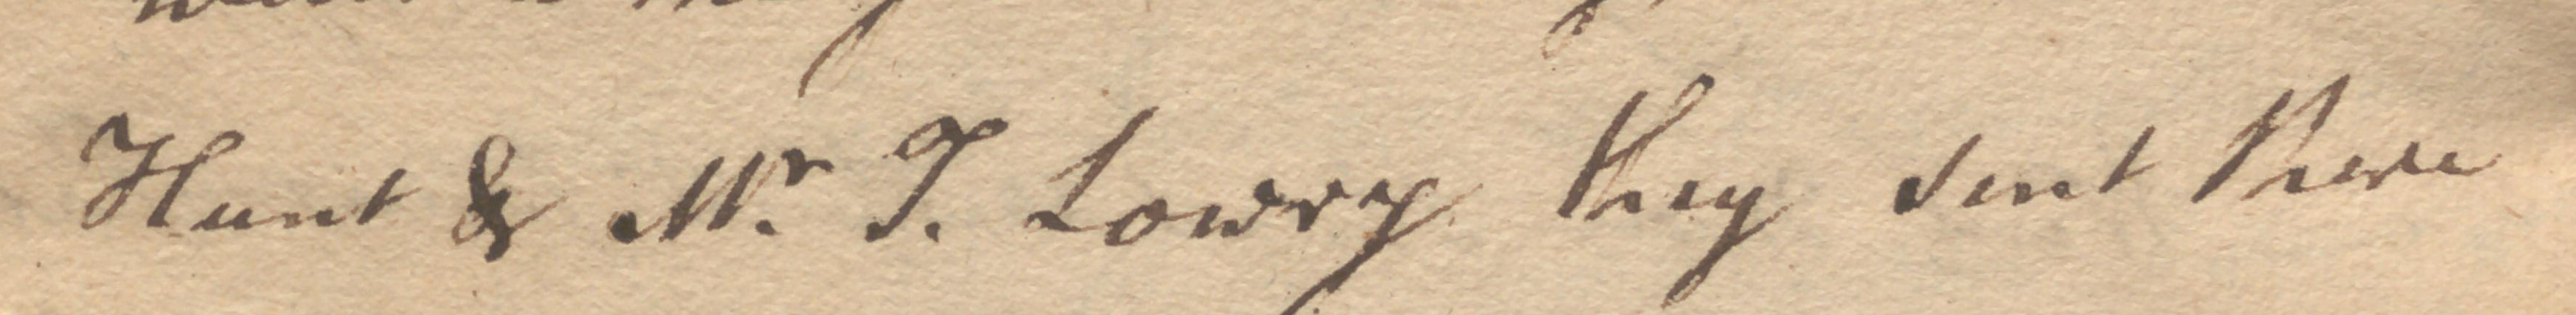Hunt & M^r. T. Lowry they sent there
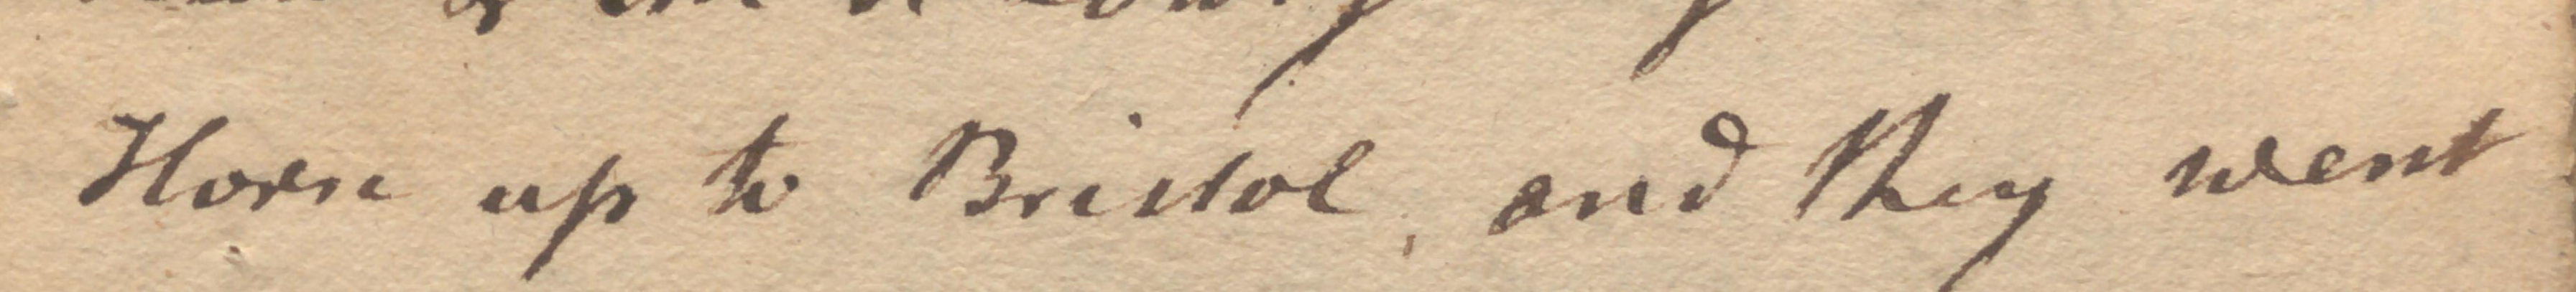Horse up to Bristol and they went
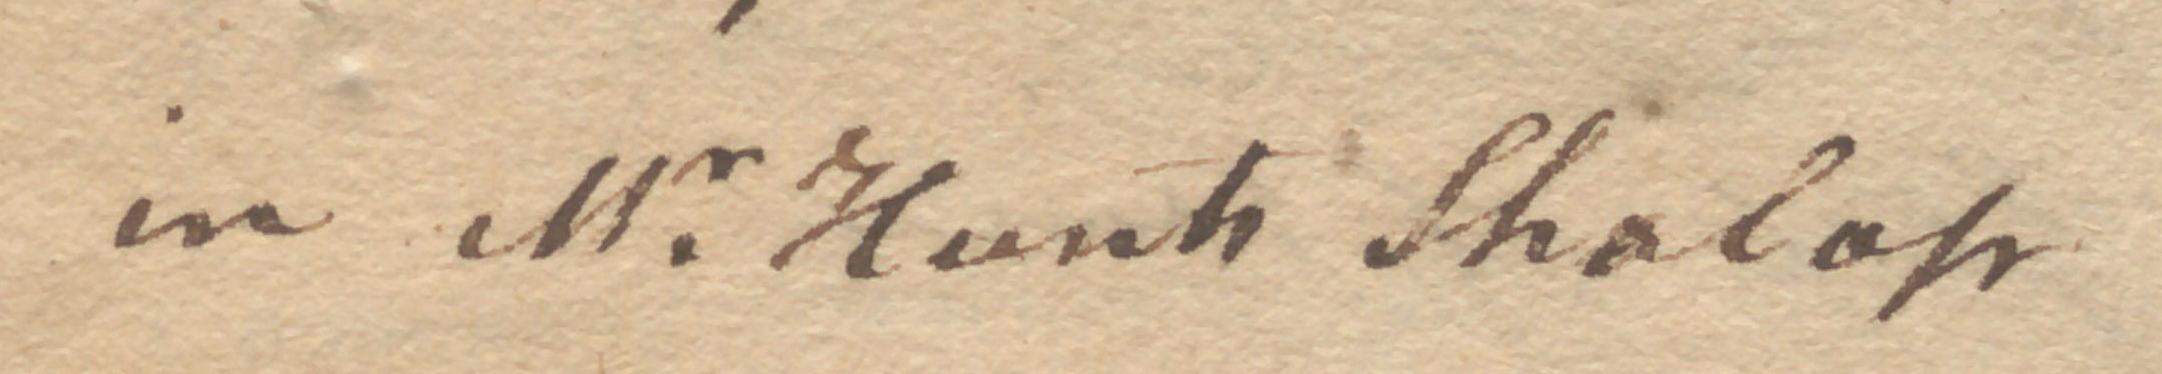in M^r. Hunts Shalop
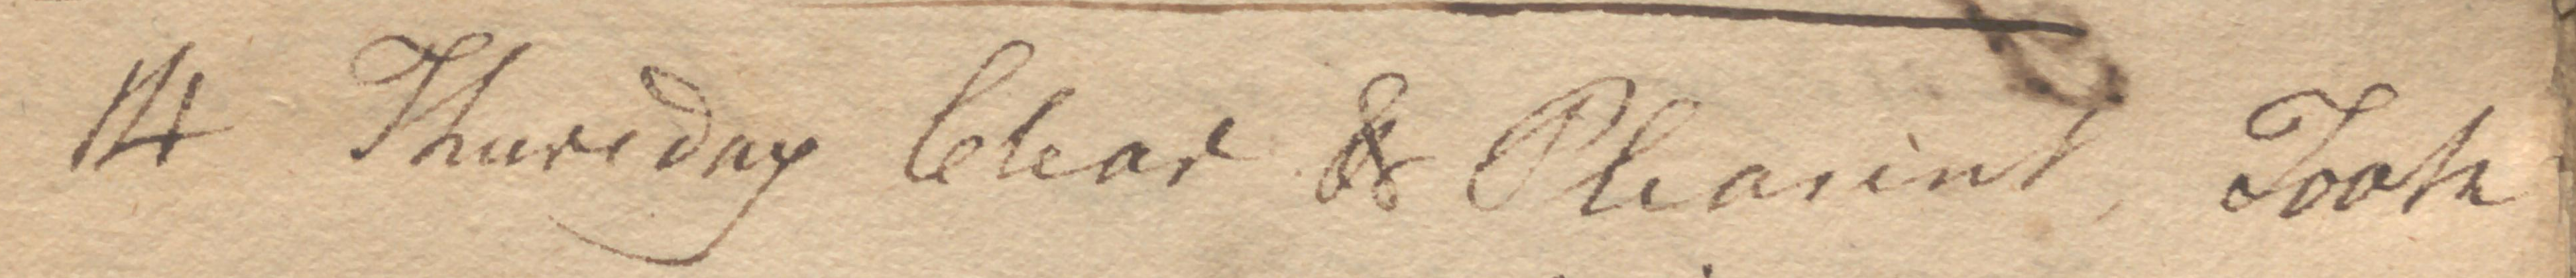14 Thursday Clear & Pleasent Took
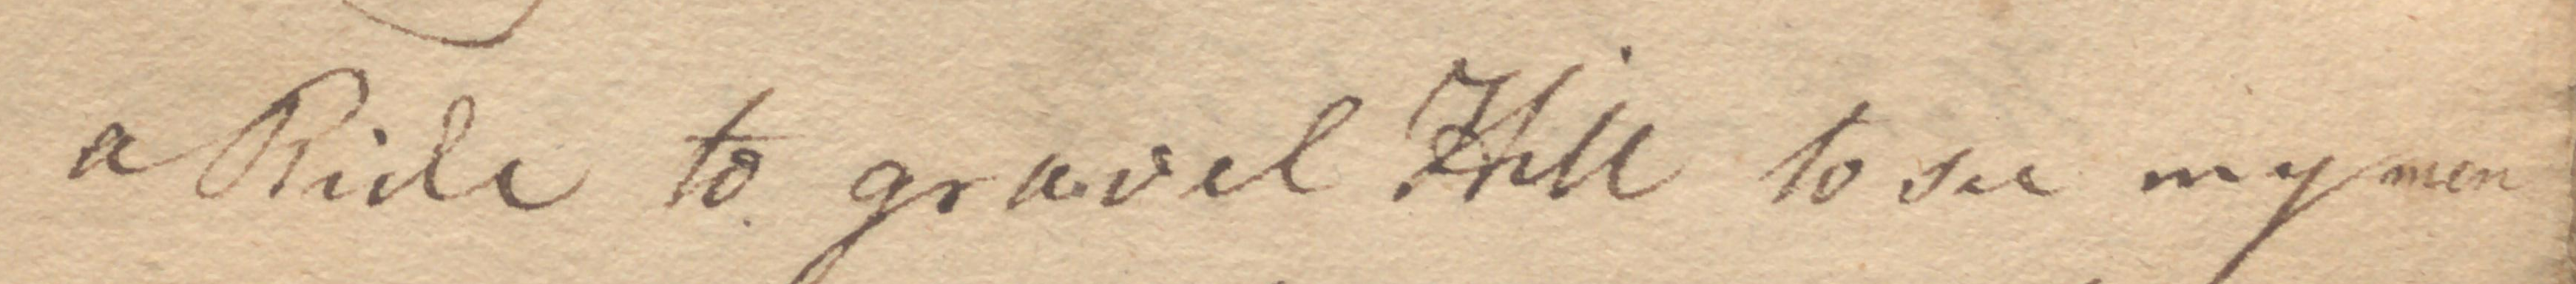a Ride to gravel Hill to see my men
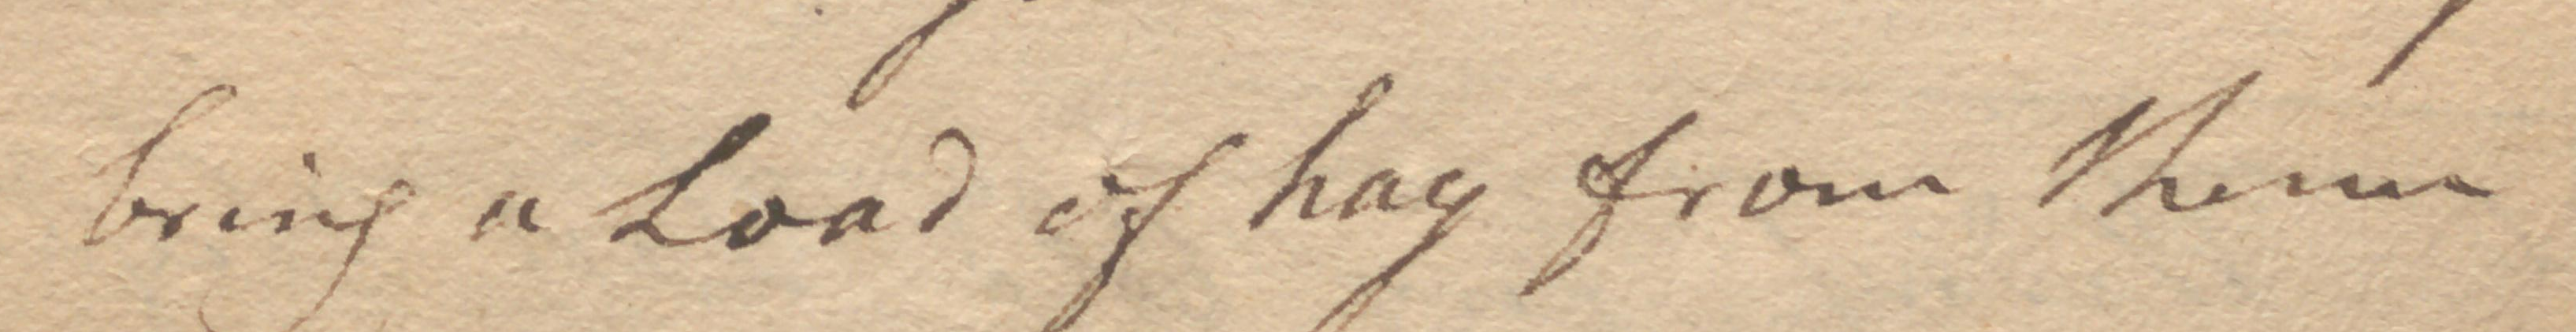bring a Load of hay from there
